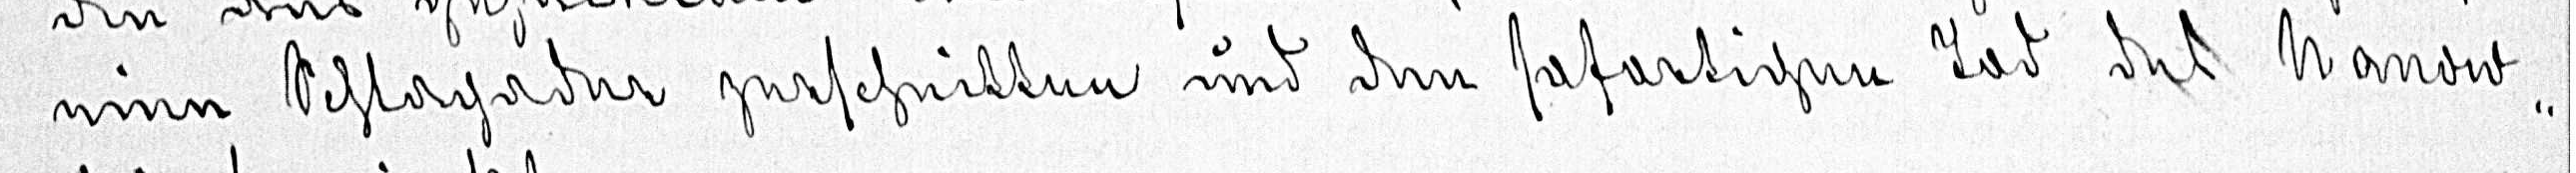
eine Schlagader zerschnitten und den sofortigen Tod des Nanow¬
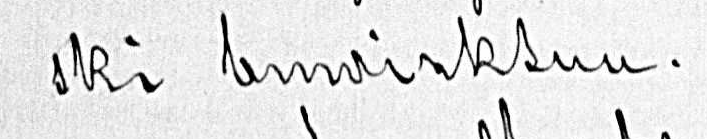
ski bewirkten.
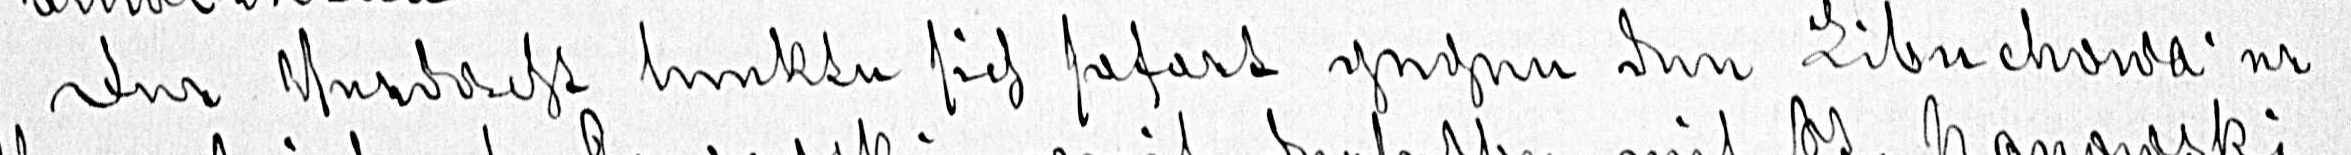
Der Verdacht lente sich sofort gegen den Zibuchowa’ne
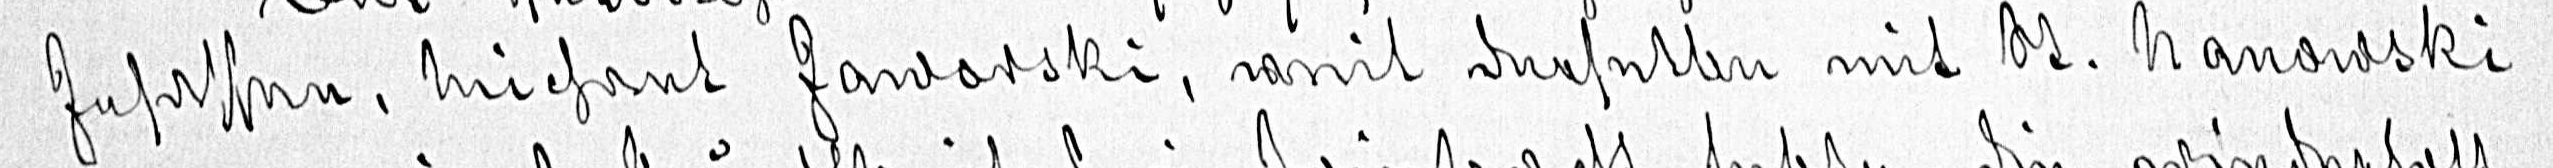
Insassen, Michael Jaworksi, weil derselbe mit St. Nanowski
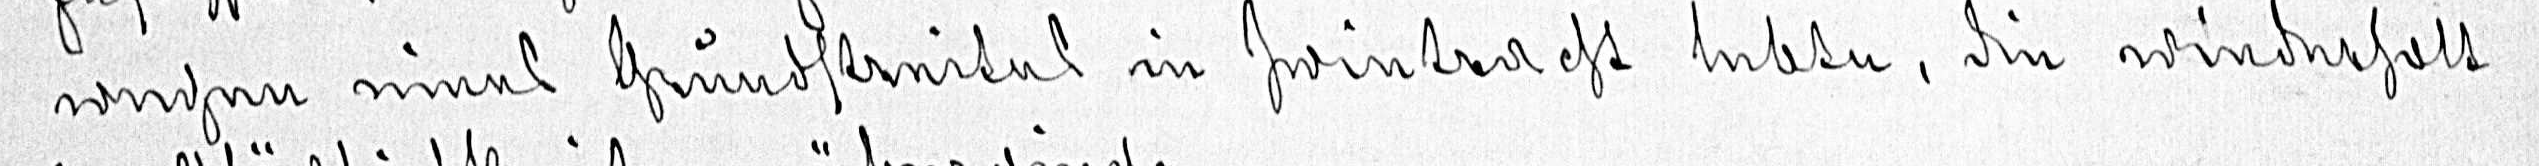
wegen eines Grundstreites in Zwietracht lebte, die wiederholt
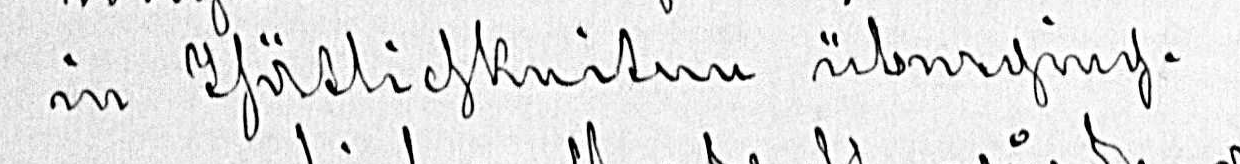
in Thätlichkeiten überging.
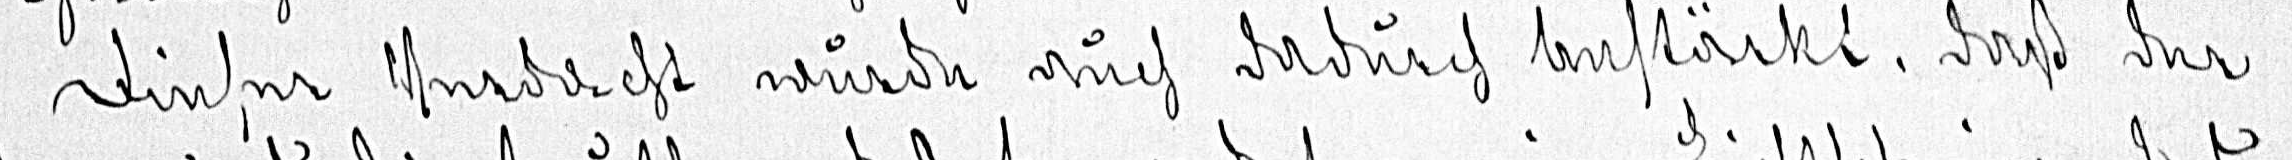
Dieser Verdacht wurde auch dadurch bestärkt, daß der
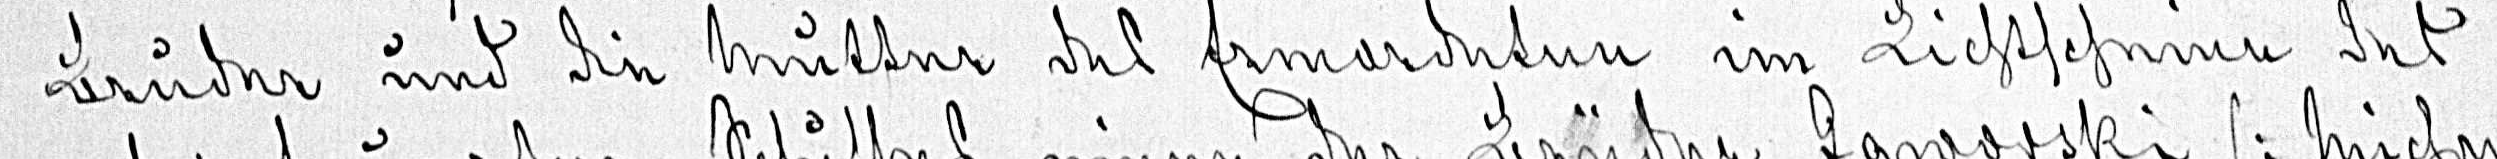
Bruder und die Mutter des Ermordeten inm Lichtscheine des
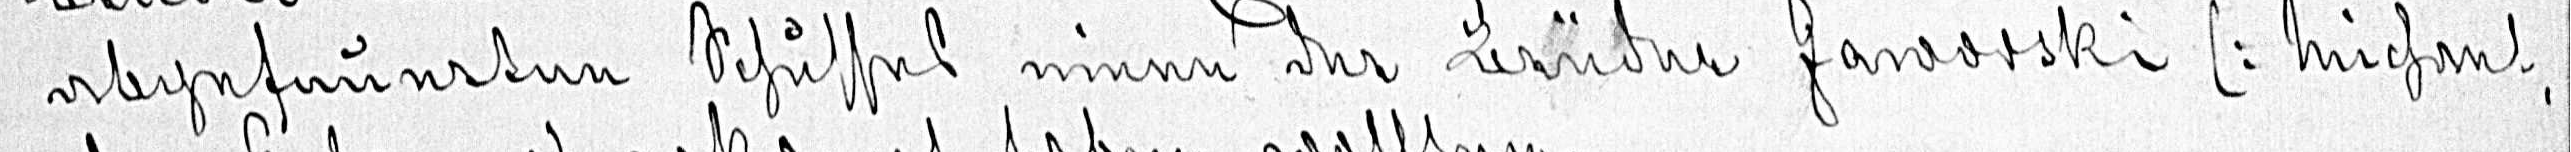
abgefeuerten Schusses einen der Brüder Jaworksi (Michael
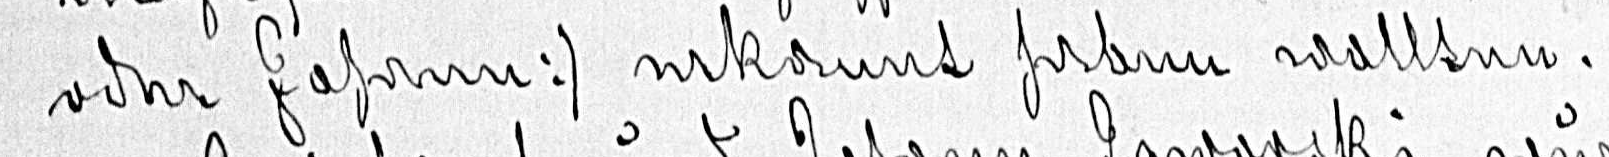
oder Johann) erkannt haben wollten.
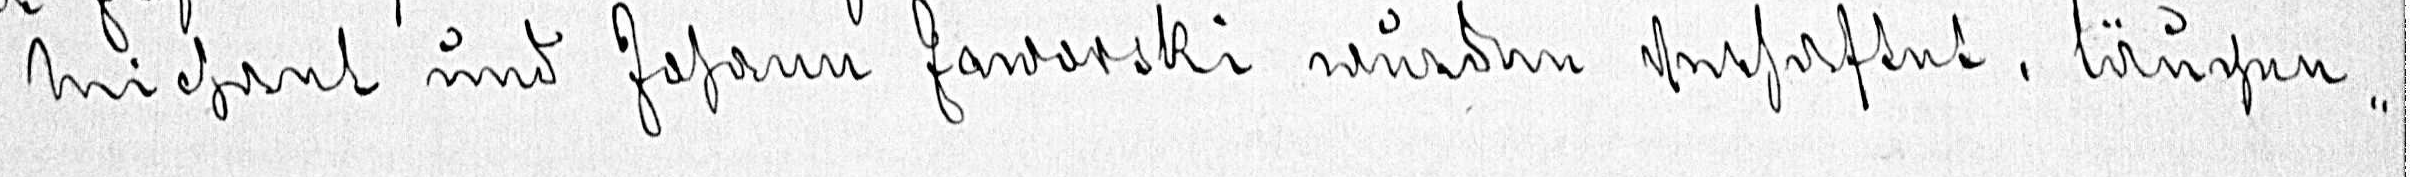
Michael und Johann Jaworski wurden verhaftet, läugne¬
